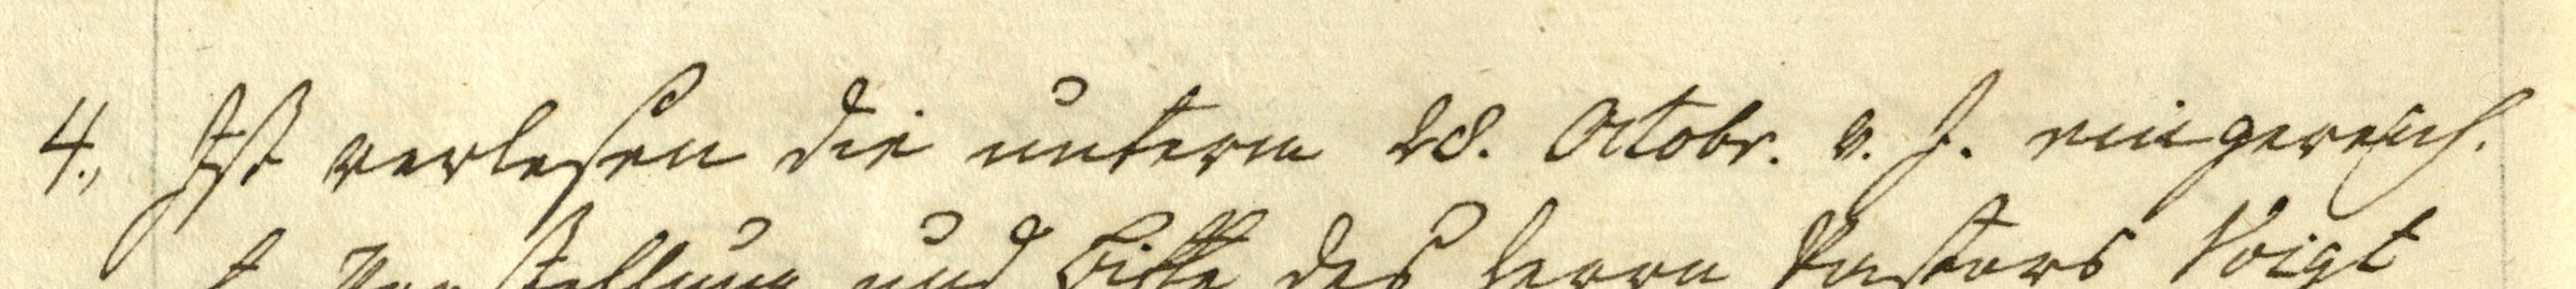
4., Ist verlesen die unterm 28. Octobr. v. J. eingereich¬
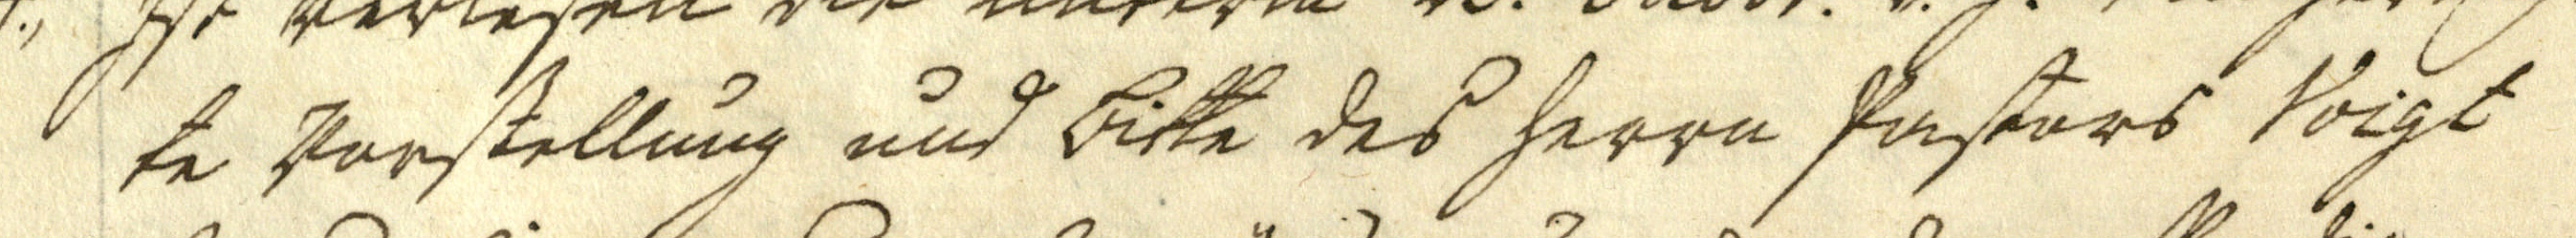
te Vorstellung und Bitte des Herrn Pastors Voigt
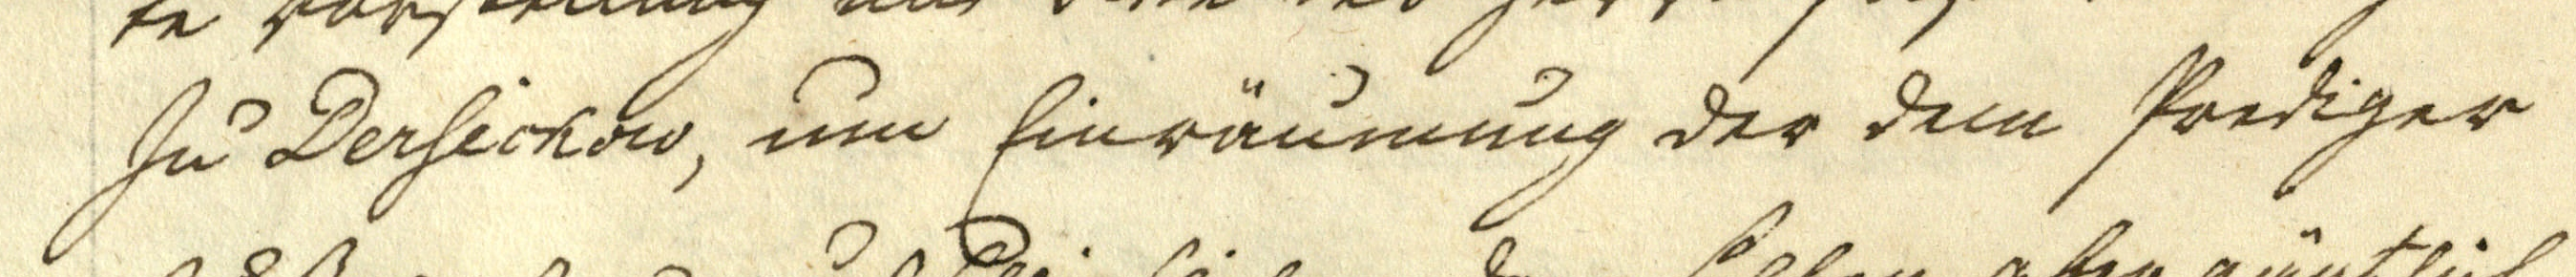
zu Deseckow, um Einräumung der dem Prediger
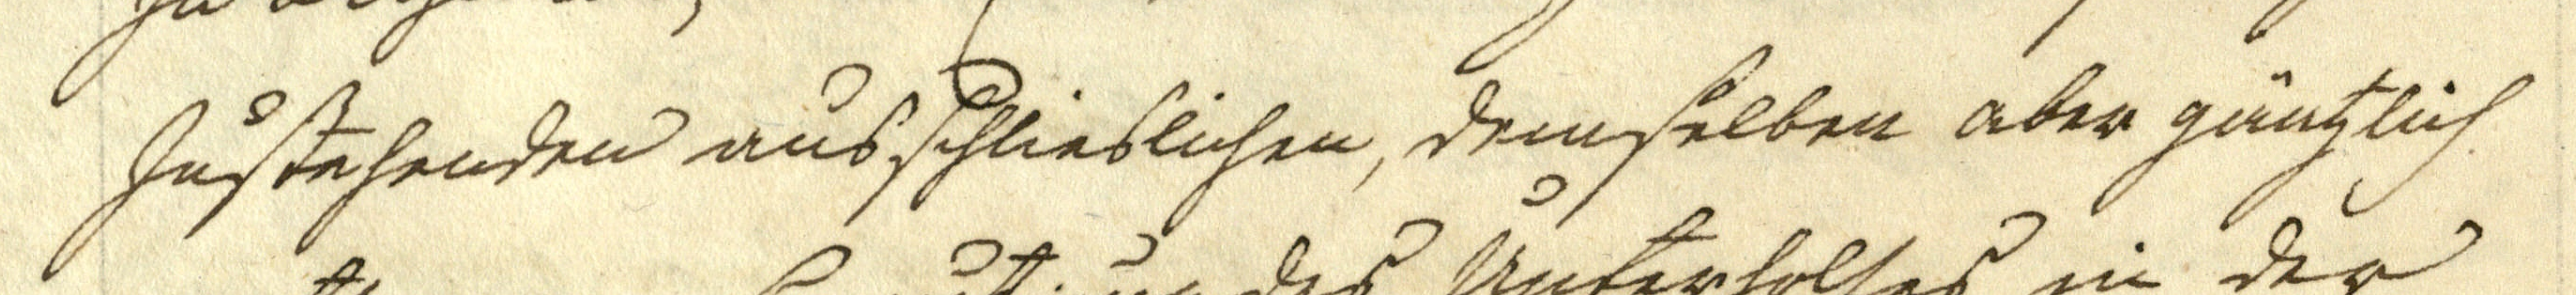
zustehenden ausschlieslichen, demselben aber gäntzlich
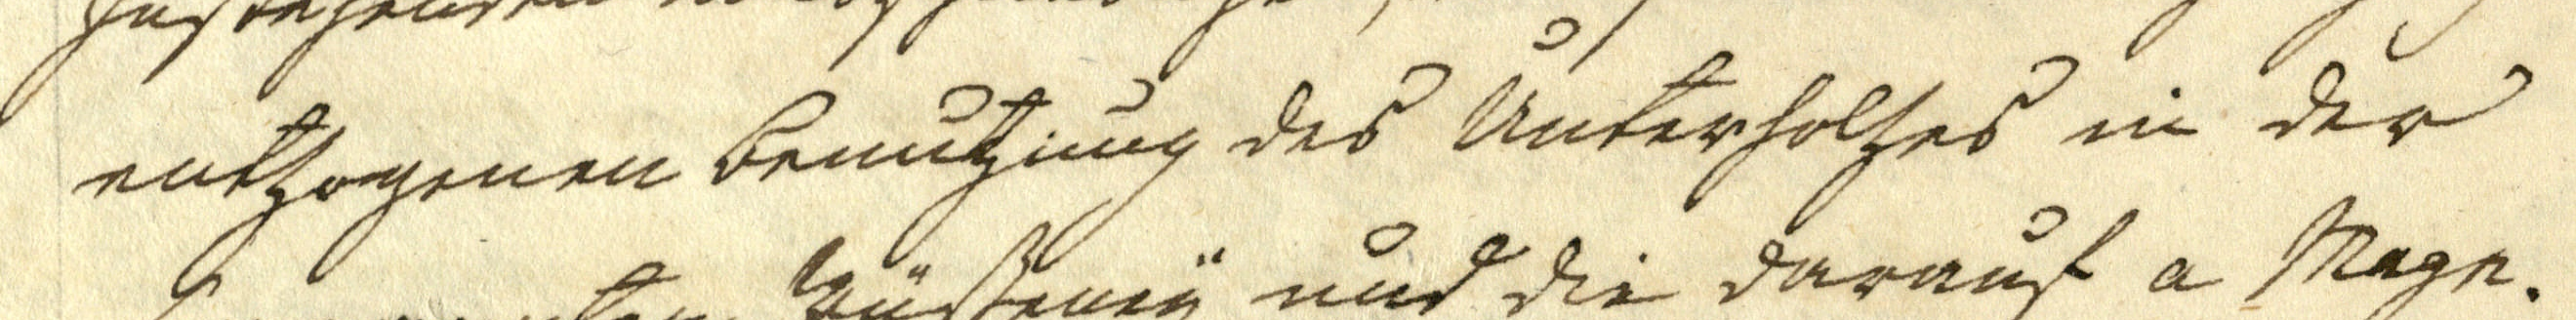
entzogenen Benutzung des Unterholzes in der
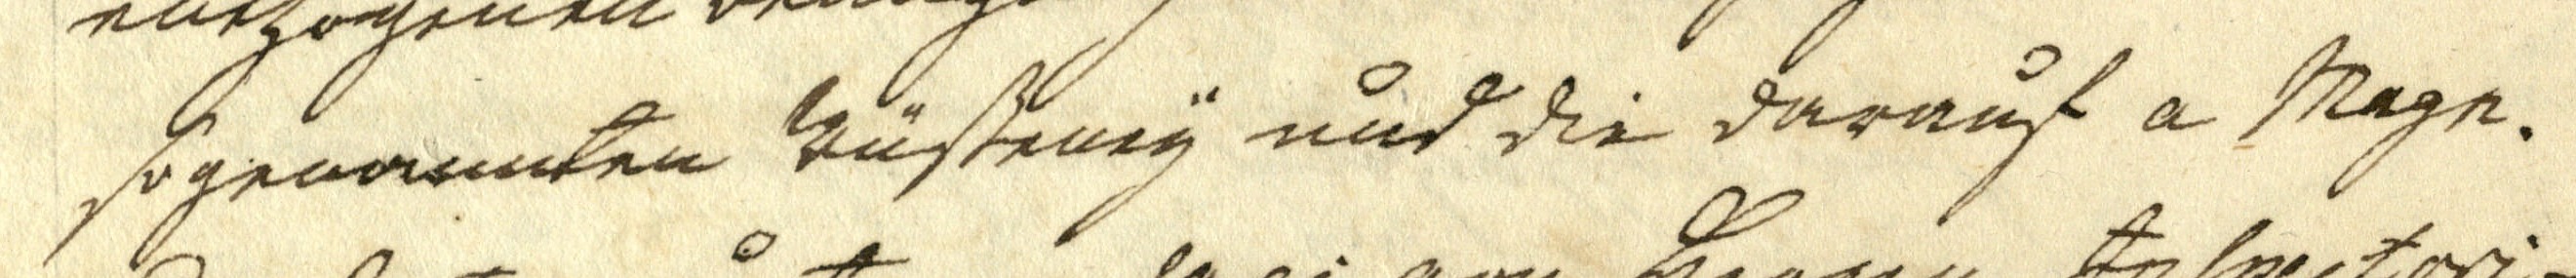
so genannten Wüsteneÿ und die darauf a Magn.
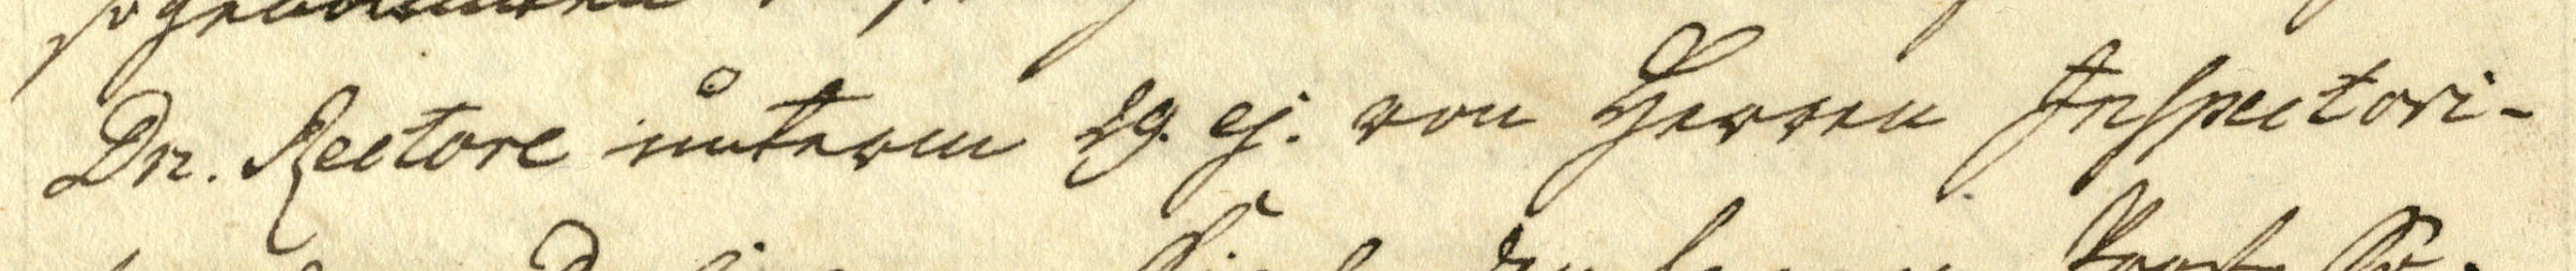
Dn. Rectore unterm 29. ej. von Herren Inspectori¬
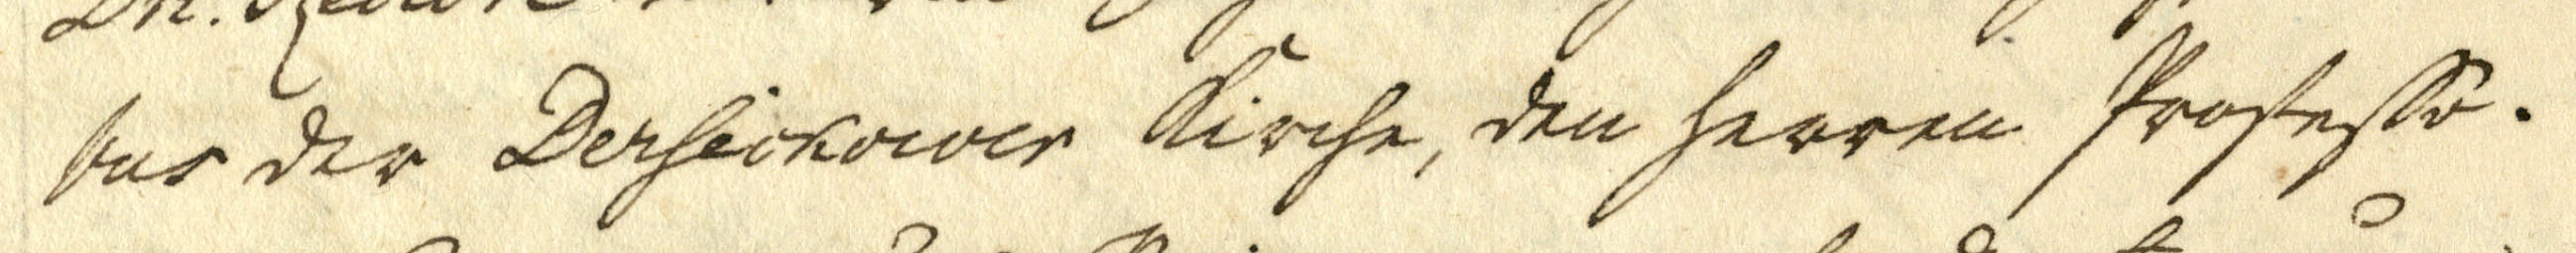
bus der Derseckower Kirche, den Herren Professo¬
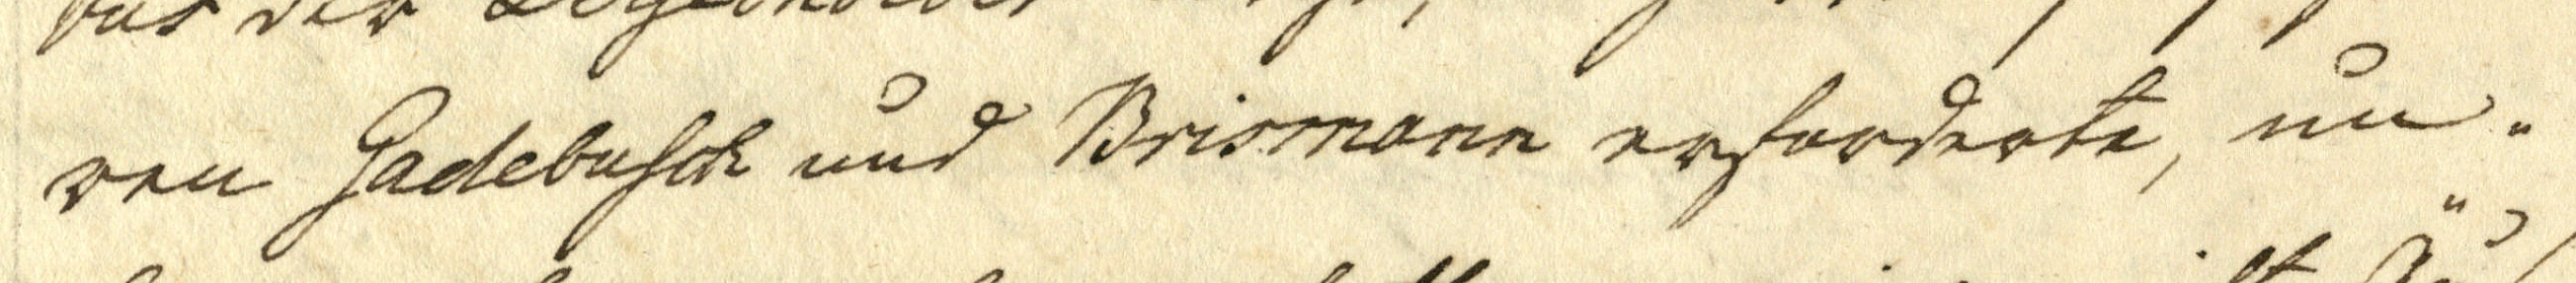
ren Gadebusch und Brismann erforderte, un¬
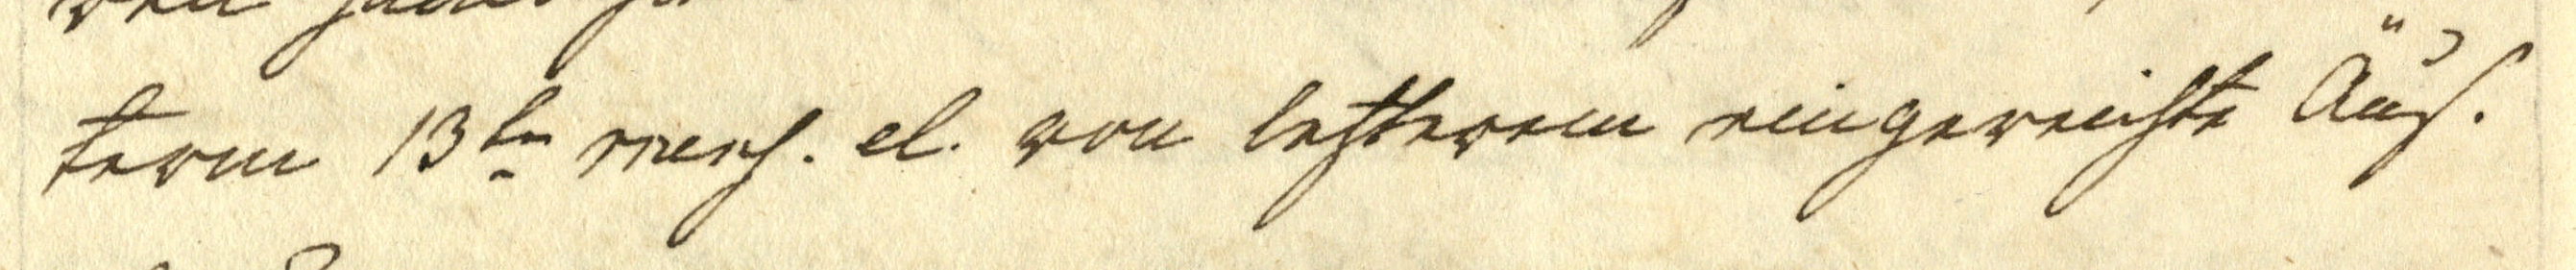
term 13 ten mens. el. von letzterem eingereichte Äus¬
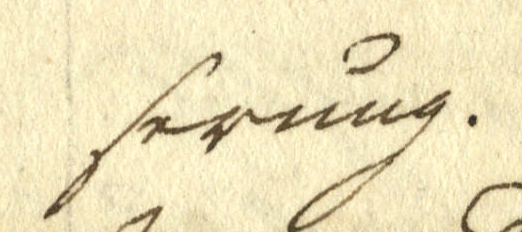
serung.
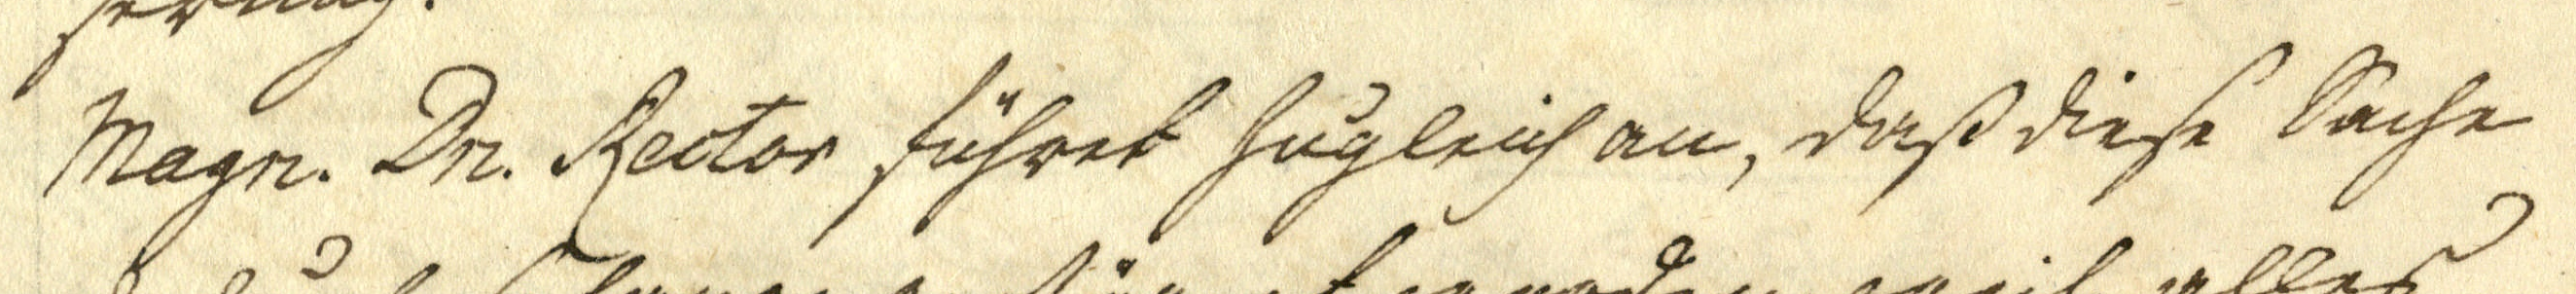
Magn. Dn. Rector führet zugleich an, daß diese Sache
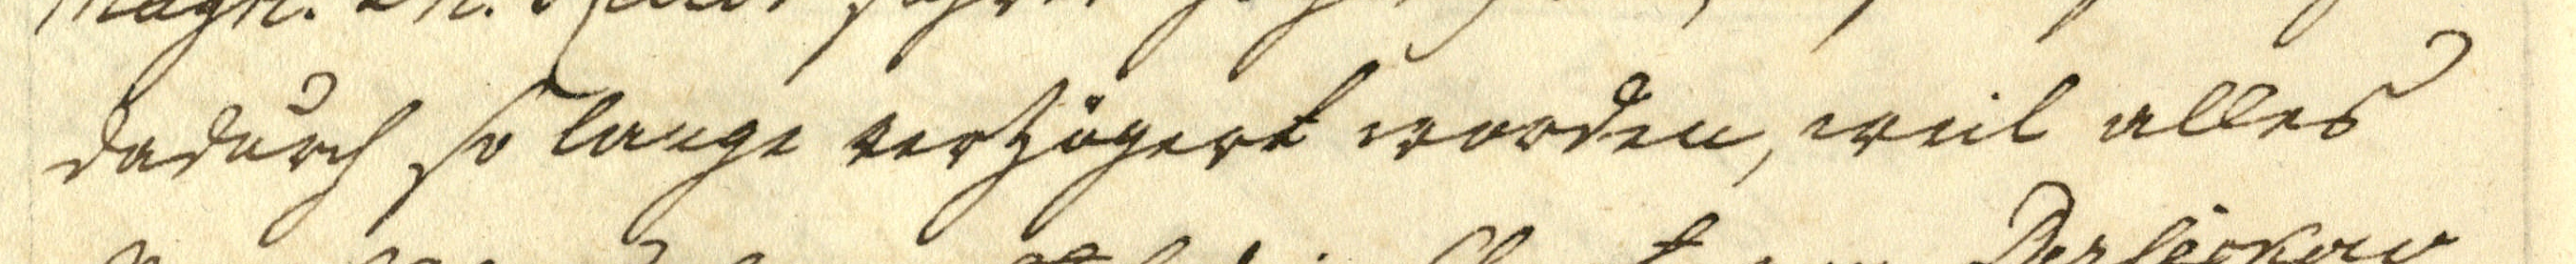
dadurch so lange verzögert worden, weil alles
